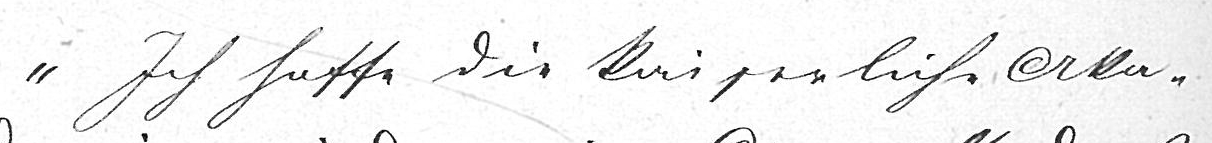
" Ich hoffe die kaiserliche Aka-
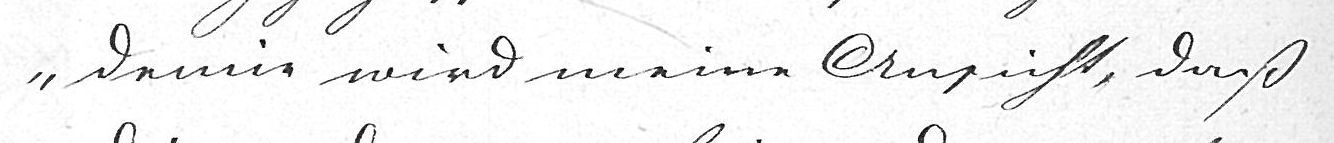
" demie wird meine Ansicht, daß
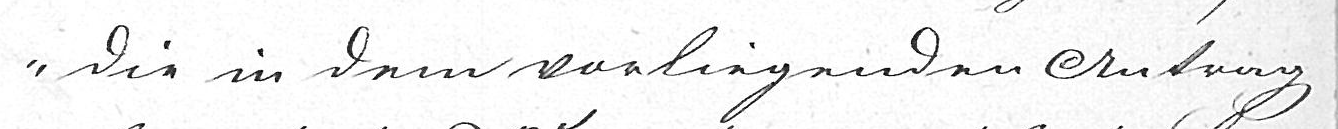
" die in dem vorliegenden Antrag
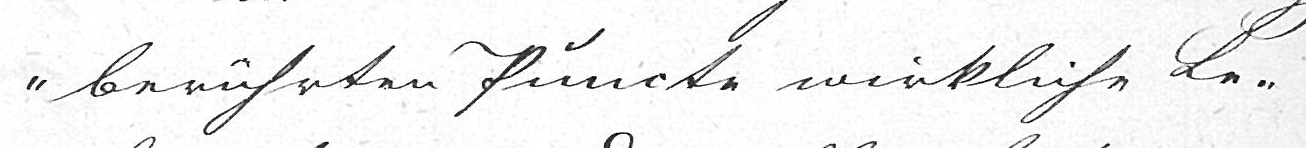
" berührten Puncte wirkliche Le-
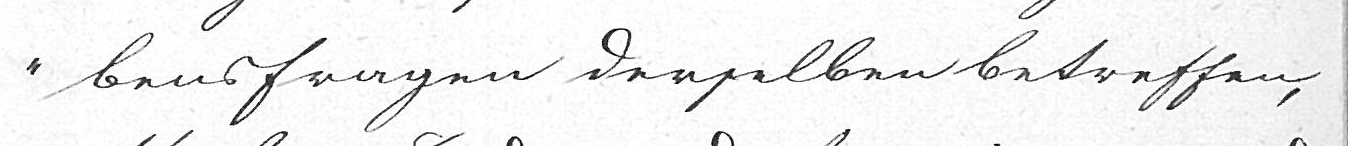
" besfragen derselben betreffen,
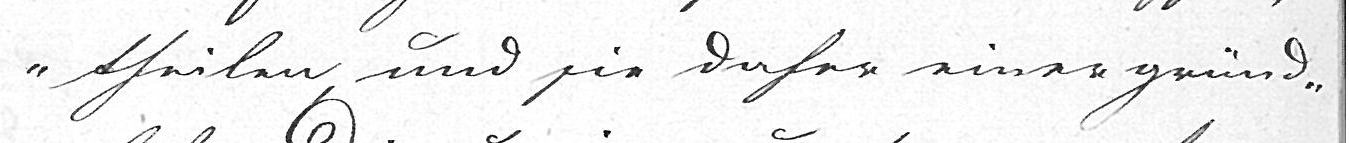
" theilen und sie daher einer gründ-
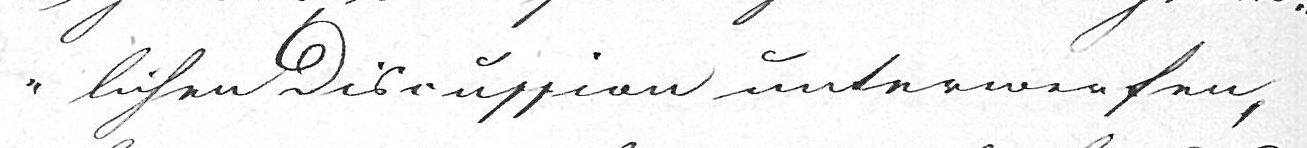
" lichen Discussion unterwerfen,
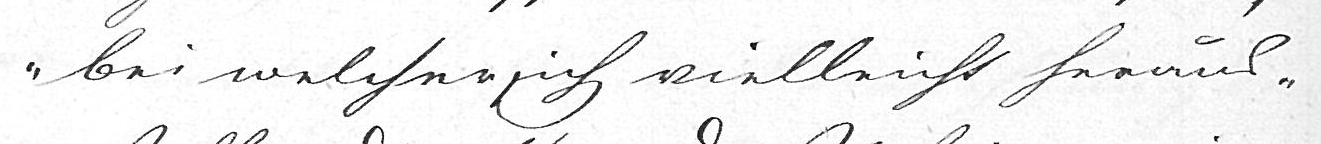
" bei welcher sich vielleicht heraus-
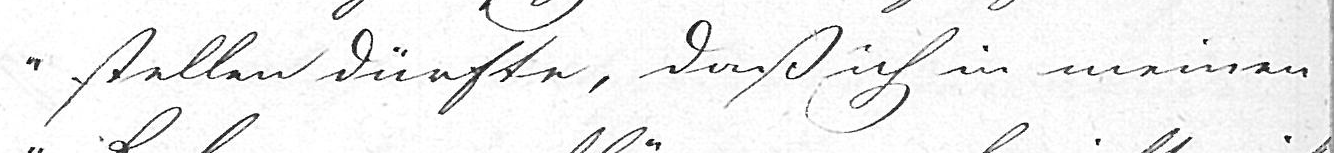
" stellen dürfte, daß ich in meinen
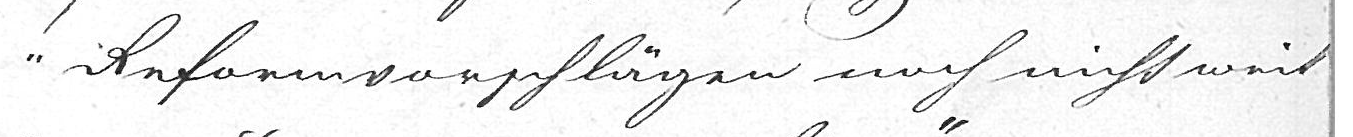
" Reformvorschlägen noch nicht weit
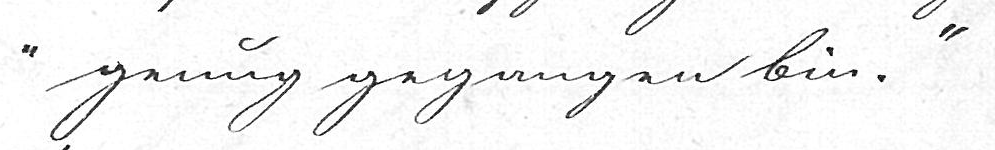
" genug gegangen bin."
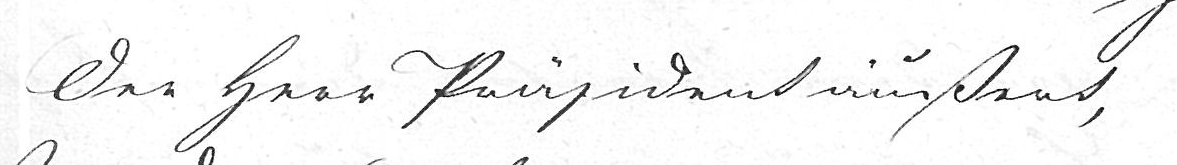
Der Herr Präsident äußert,
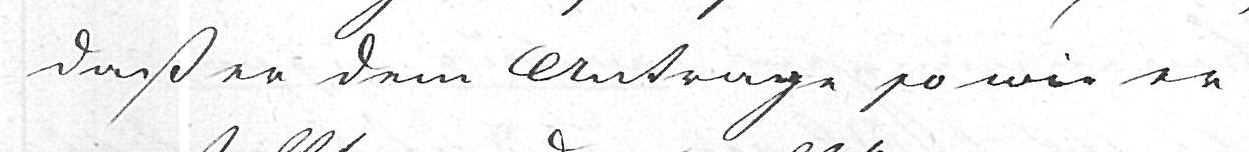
daß er dem Antrage so wir er
